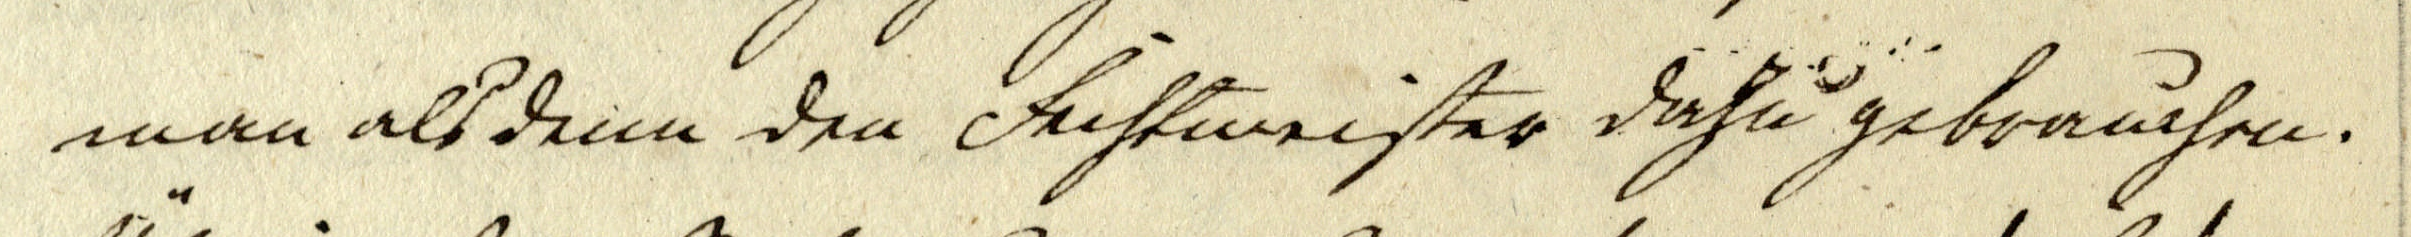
man als denn den Fechtmeister dazu gebrauchen.
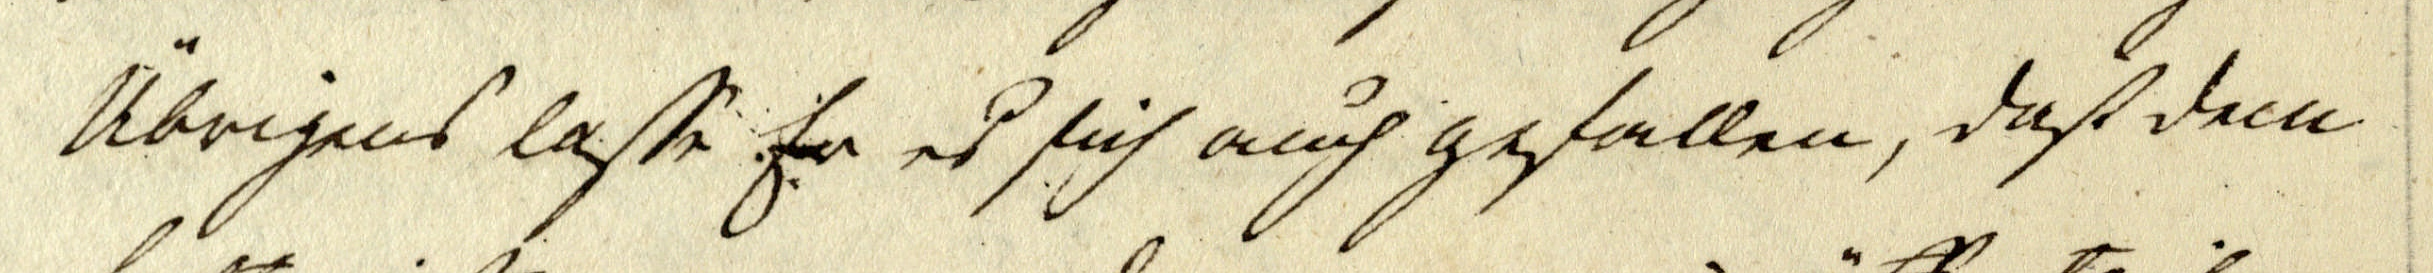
Übrigens lasse Er es sich auch gefallen, daß dem
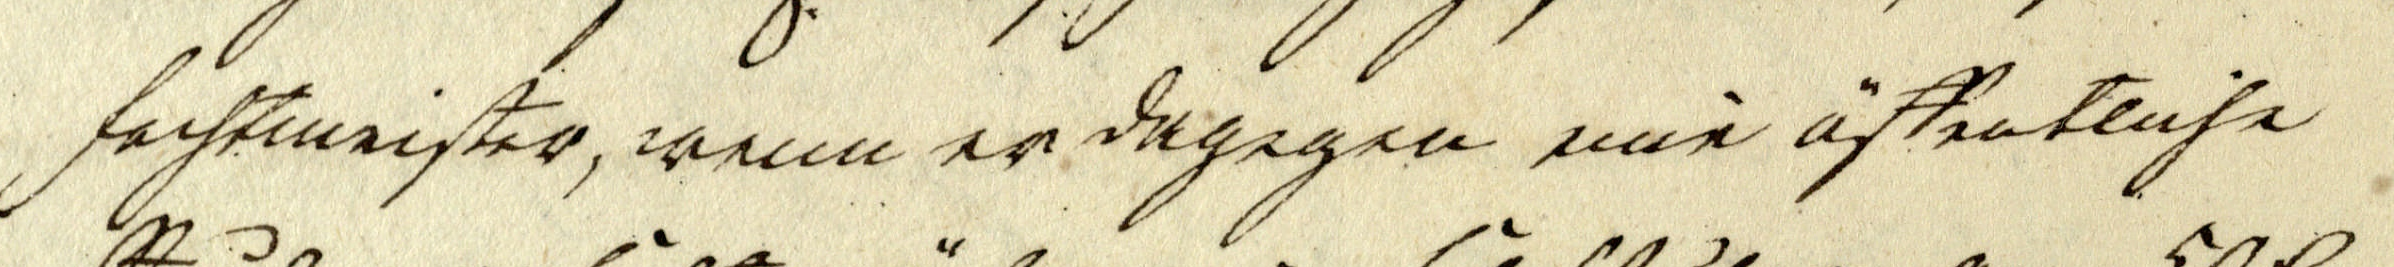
Fechtmeister, wenn er dagegen eine öffentliche
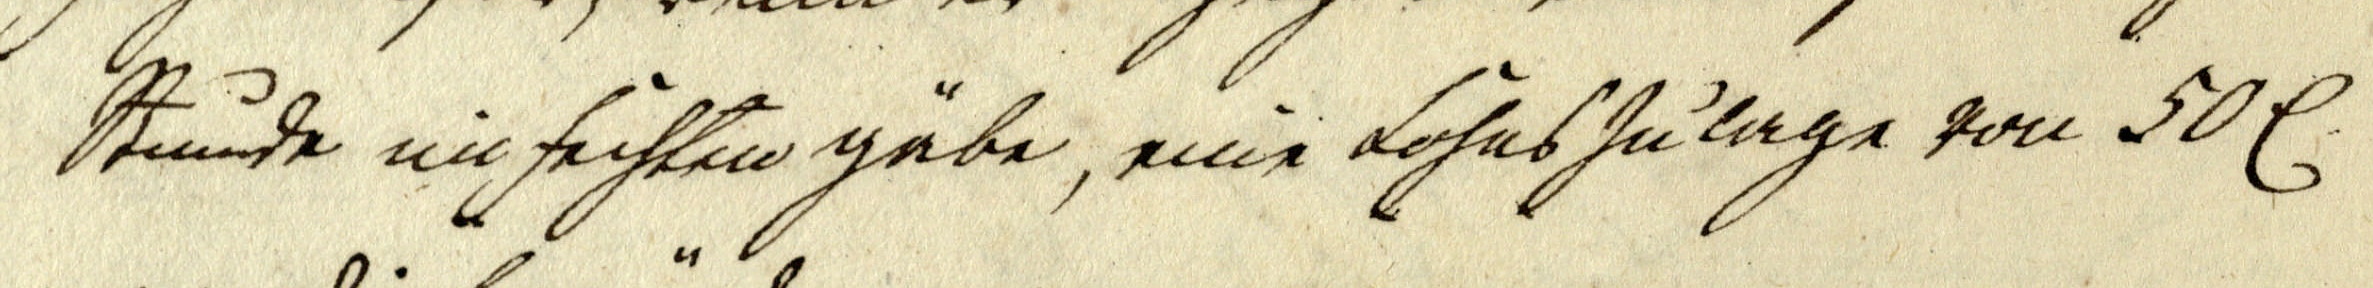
Stunde im Fechten gäbe, eine Lohnszulage von 50 l.
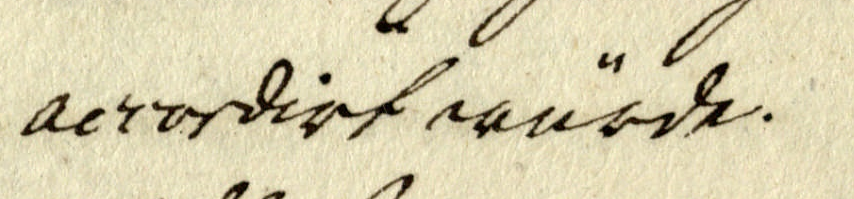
accordirt würde.
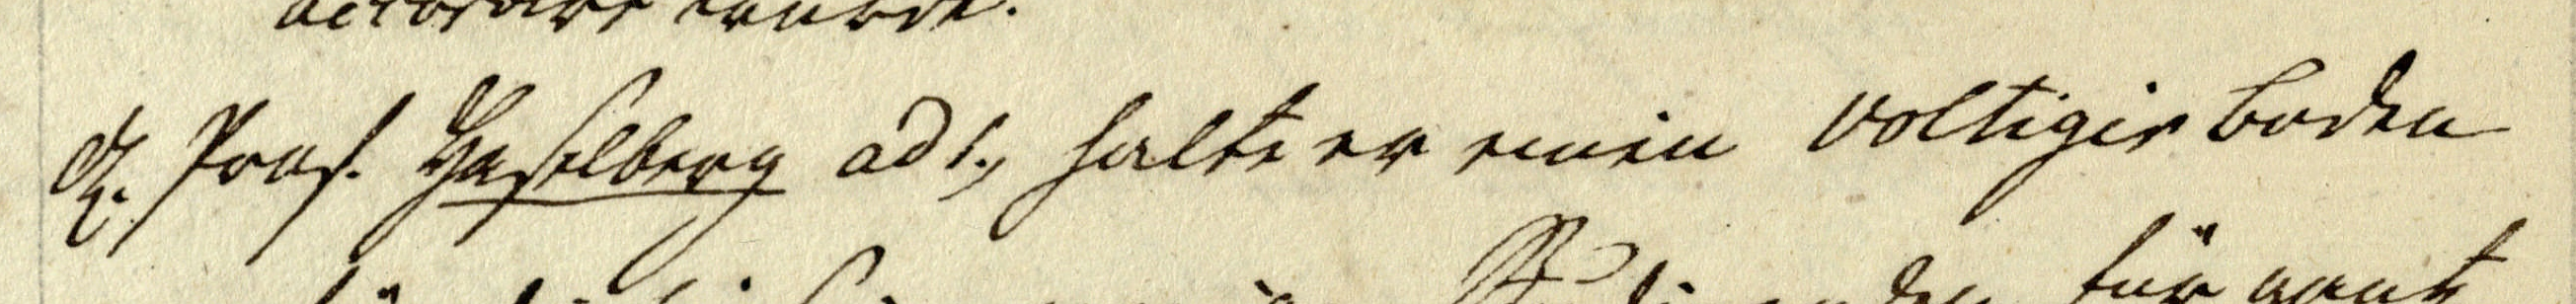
dh. Prof. Haselberg ad 1., halte er einen Voltigir Boden
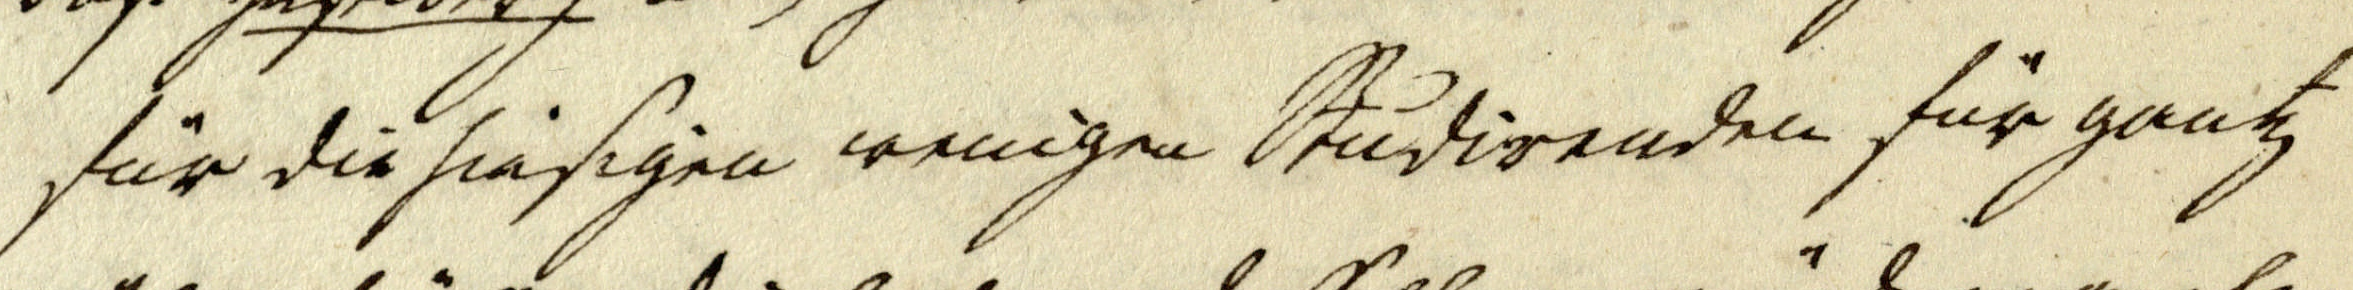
für die hiesigen wenigen Studirenden für gantz
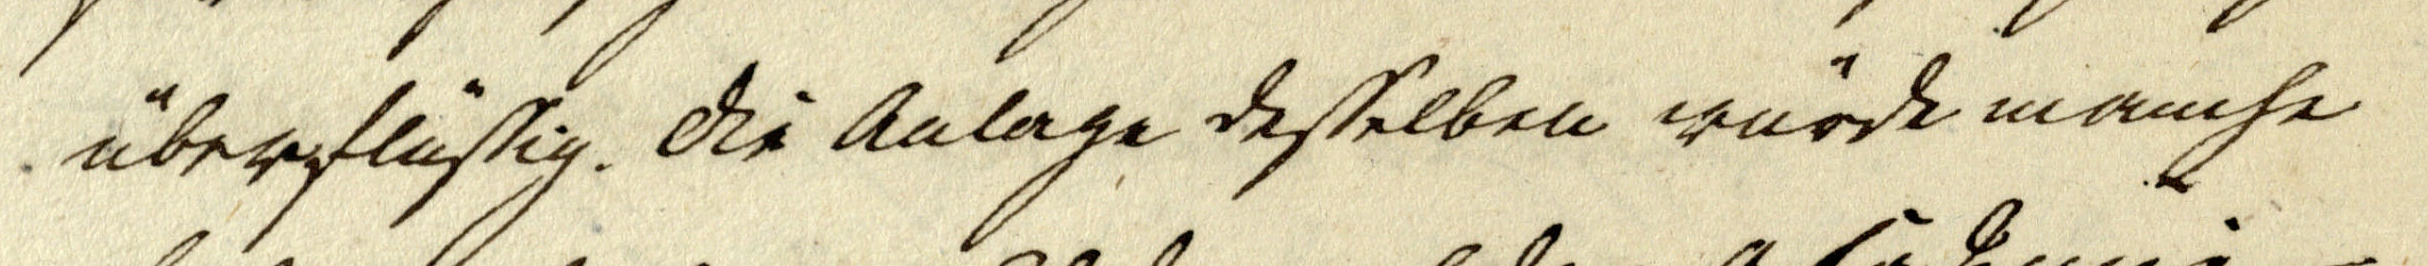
überflüssig. Die Anlage desselben würde manche
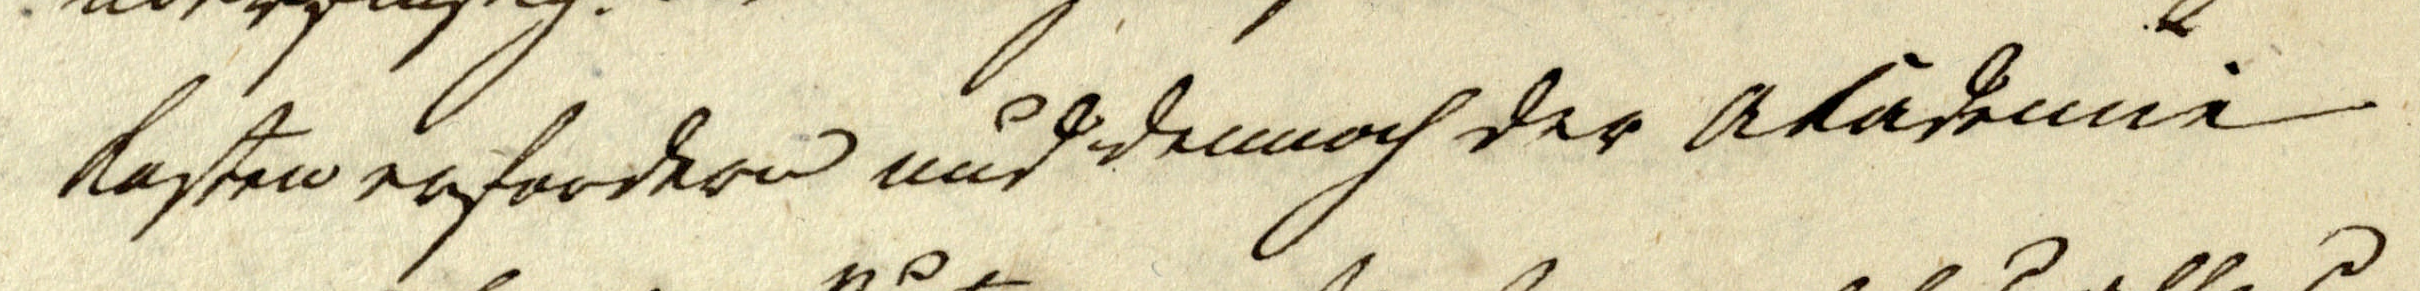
Kosten erfordern und dennoch der Akademie
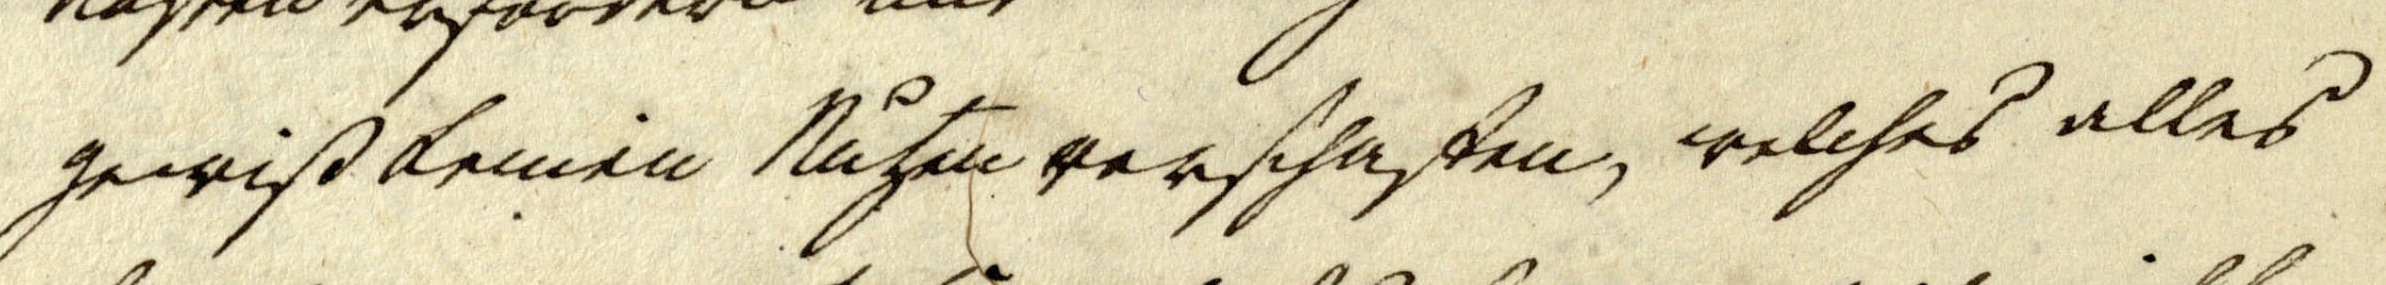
gewiß keinen Nutzen verschaffen, welches alles
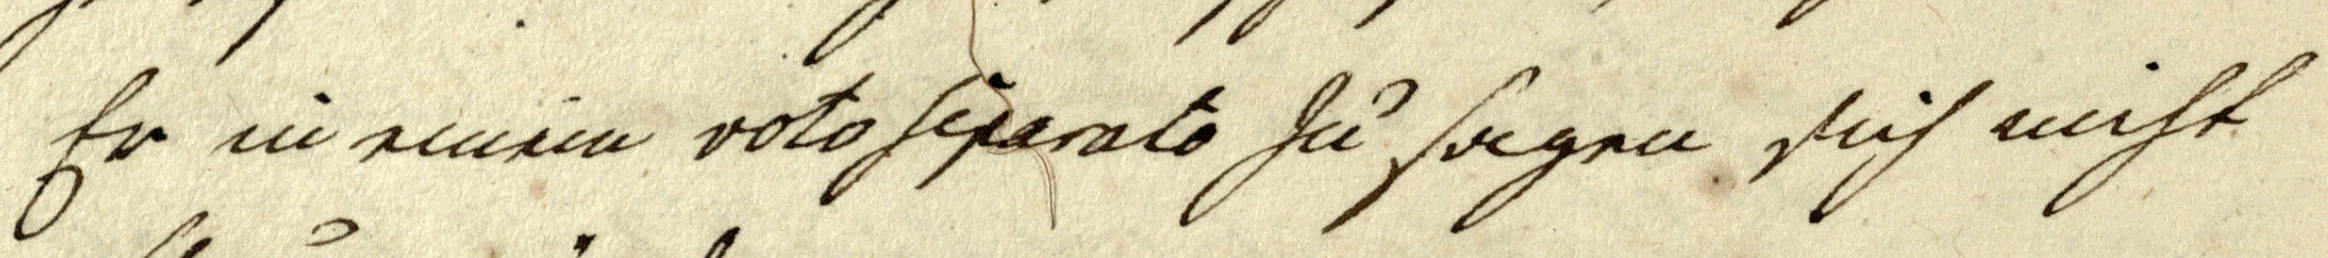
Er in einem voto separato zu sagen sich nicht
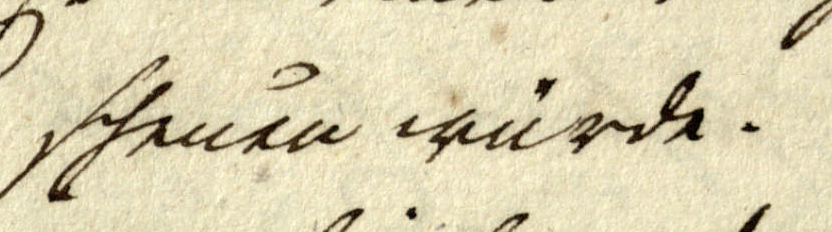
scheuen würde.
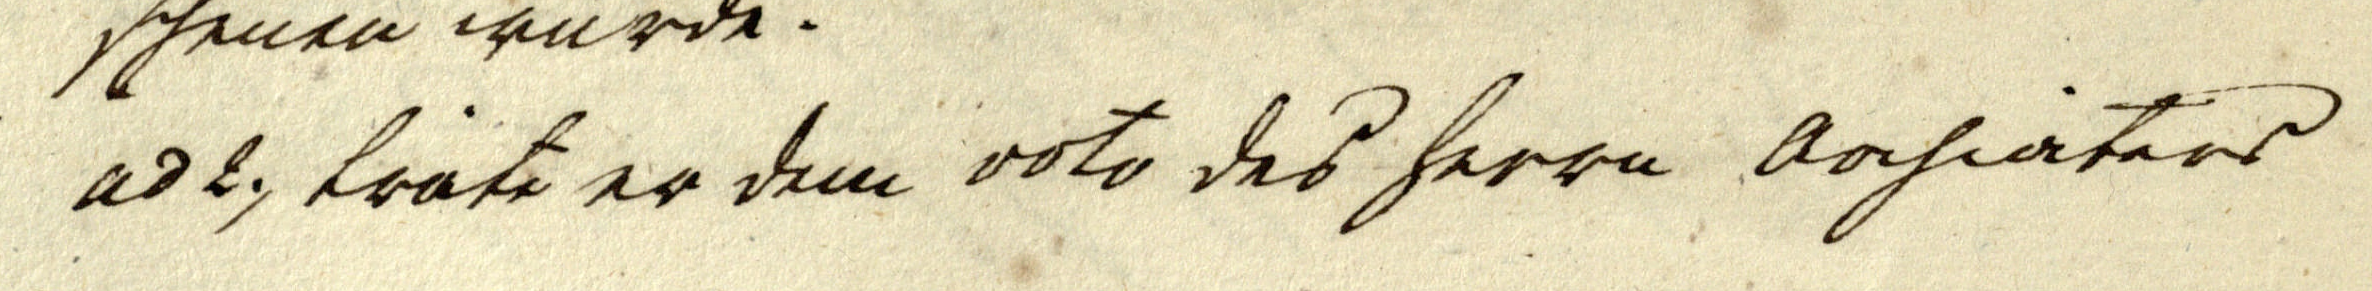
ad 2., träte er dem voto des Herrn Archiaters
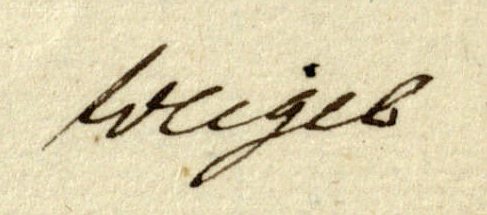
Weigel
